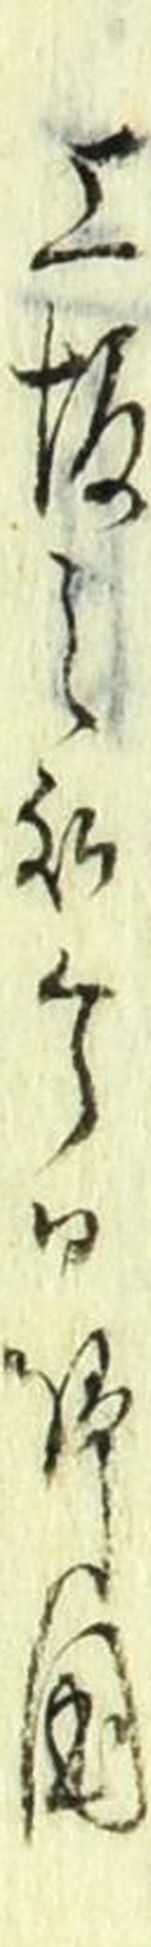上坂之処今日帰国
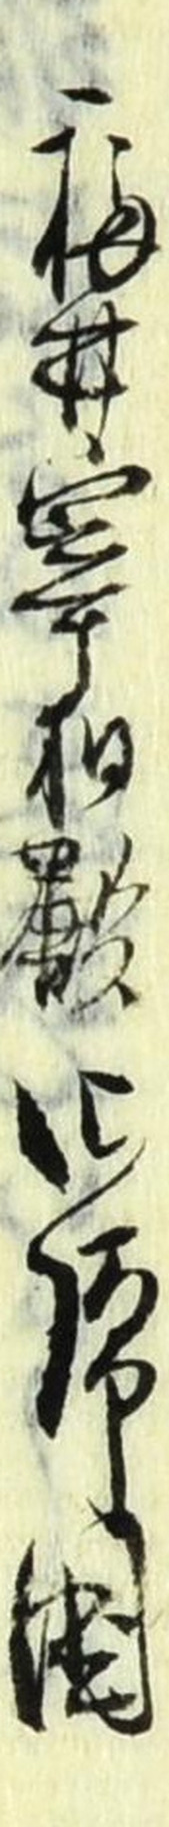福井宰相殿御帰国
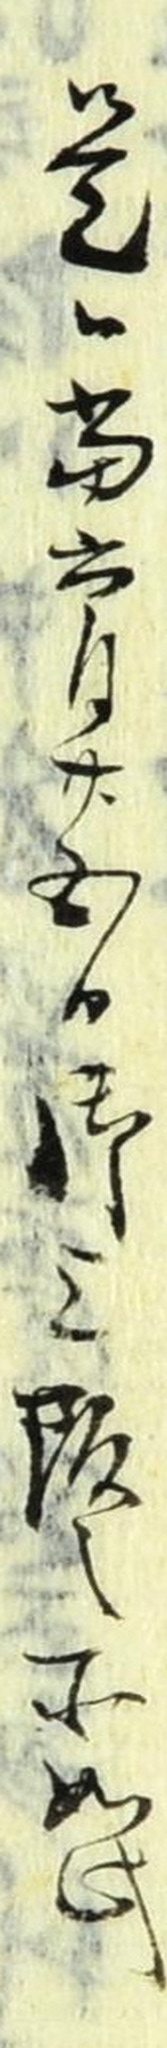是は当六月廿五日御上阪之所如此
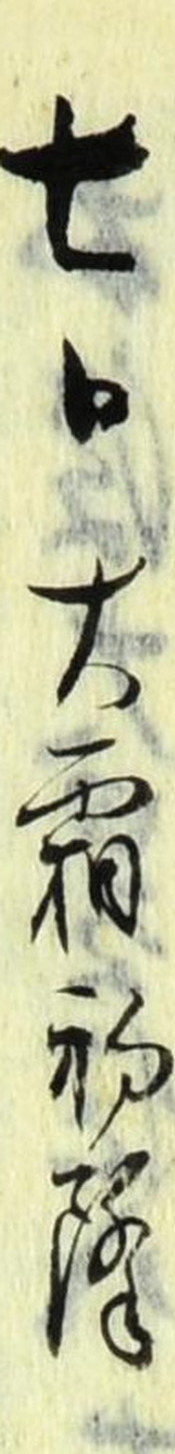七日大霜初降
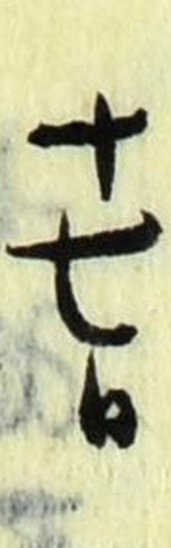十七日
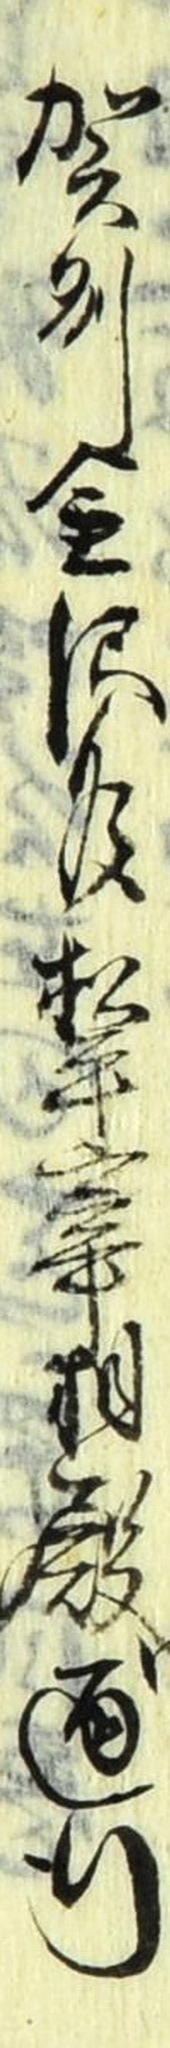賀州金沢侯松平宰相殿御通行
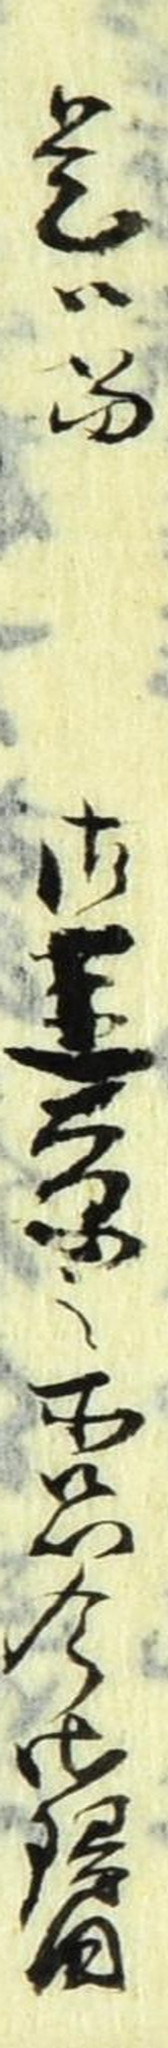是は当御上京之所只今御帰国

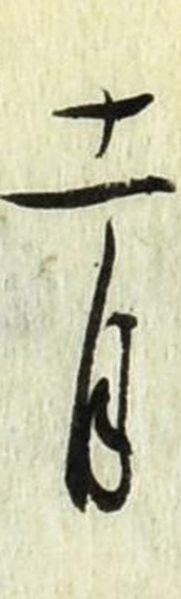十一月
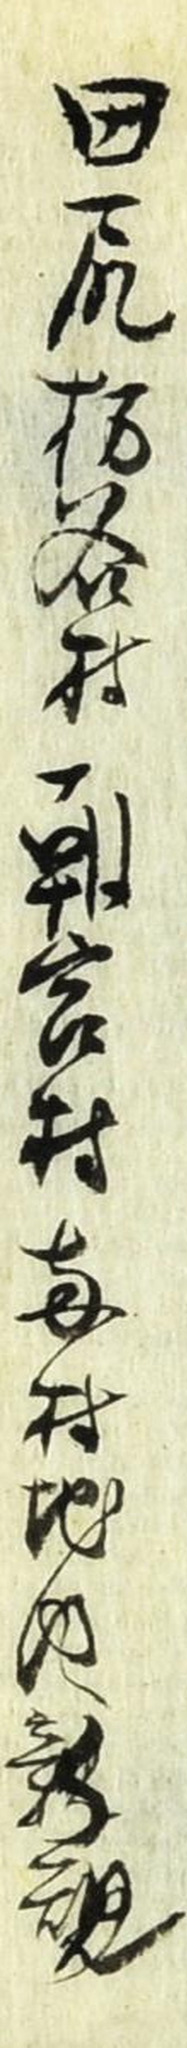田尻栃谷村朝宮村両村地内へ新規
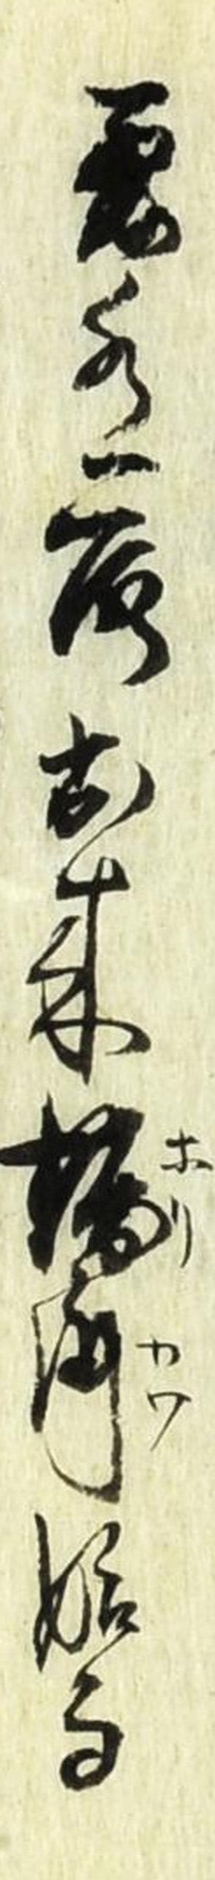悪水落出来堀河始る
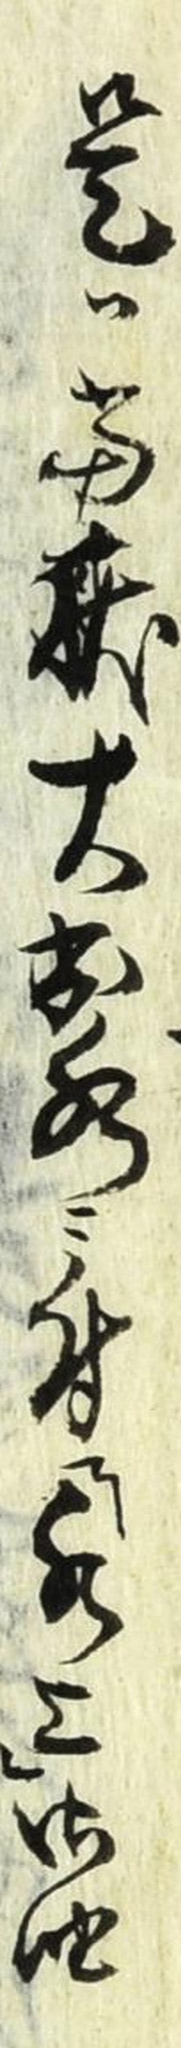是は当秋大出水に付「水上」御油
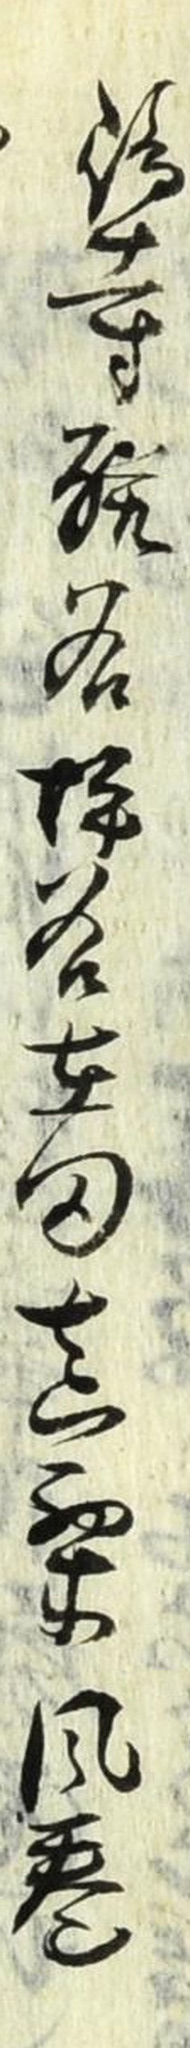島寺甑谷坪谷在田真栗風巻
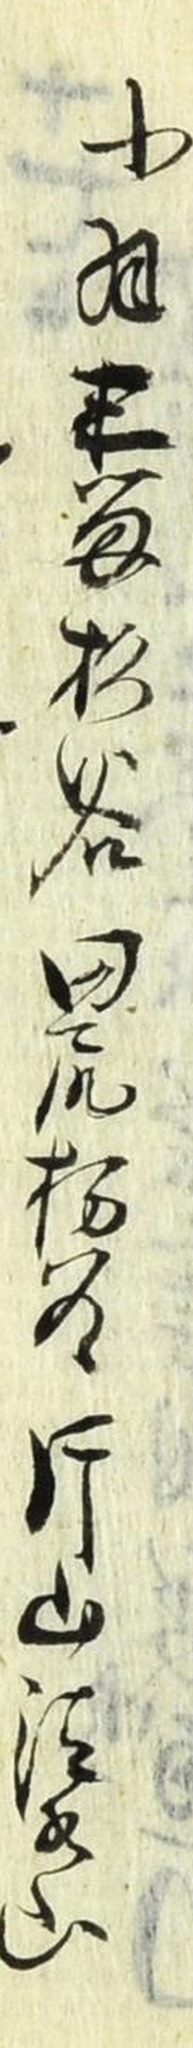小羽三留杉谷田尻栃谷片山清水山
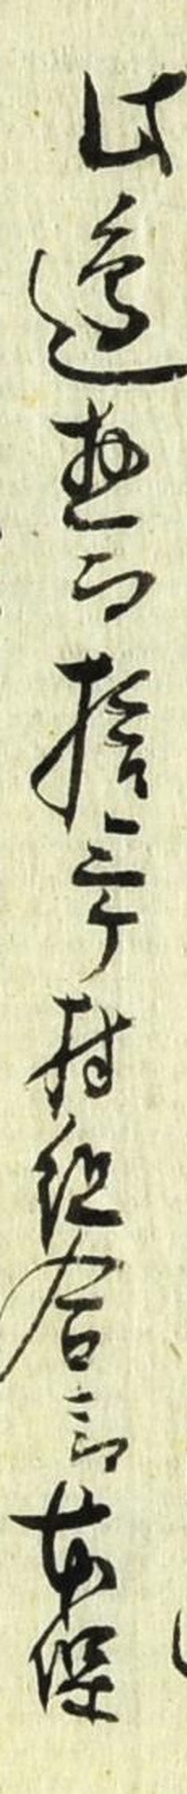此辺惣而拾三ヶ村組合に而本保
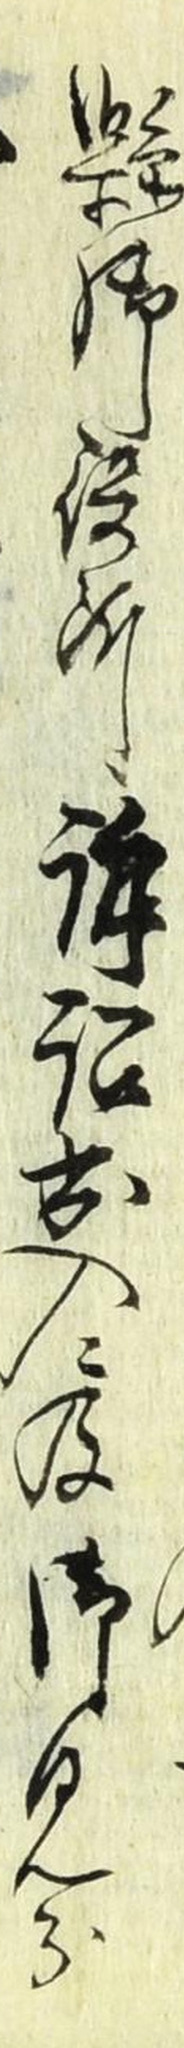県御役所に訴訟出入に及御見分
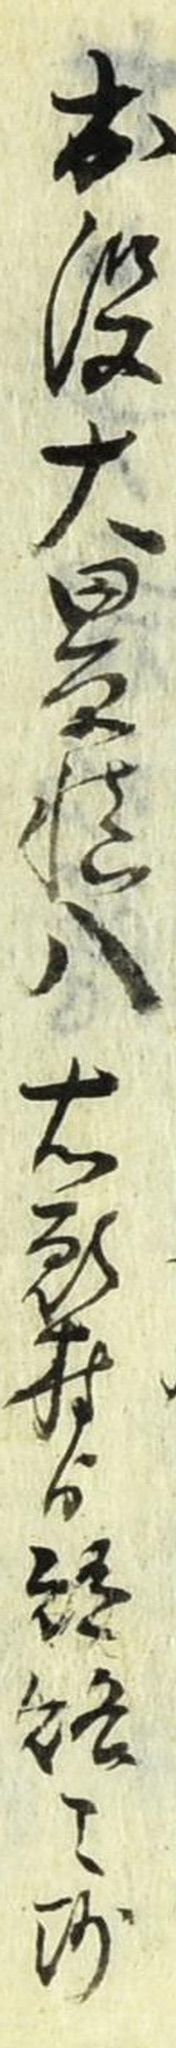出役大田原慎八右願村ゟ賄賂之沙
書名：（日記）
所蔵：福井県文書館 Fukui Prefectural Archives
